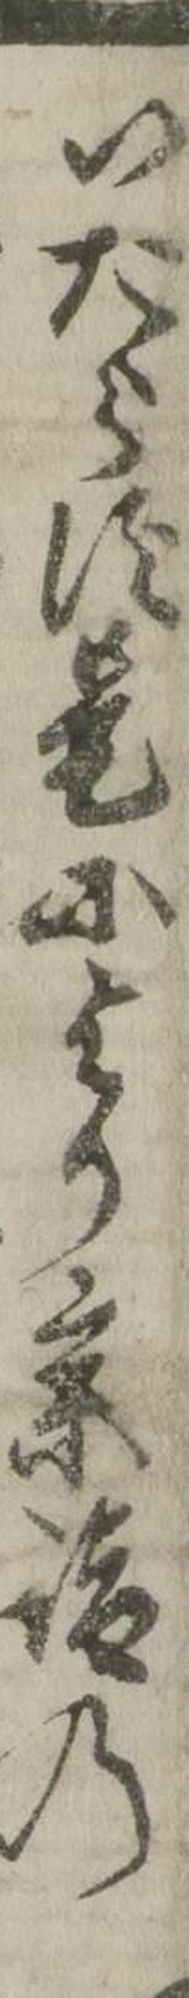いたらす是により参詣乃
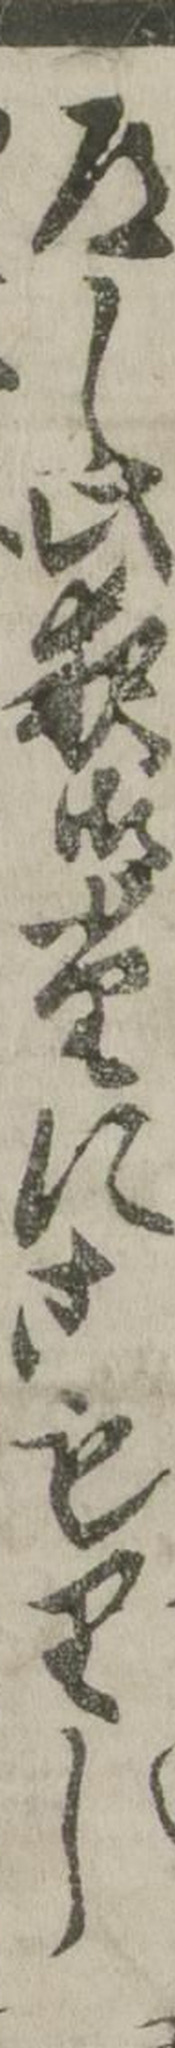道し此夜御堂にこもりし
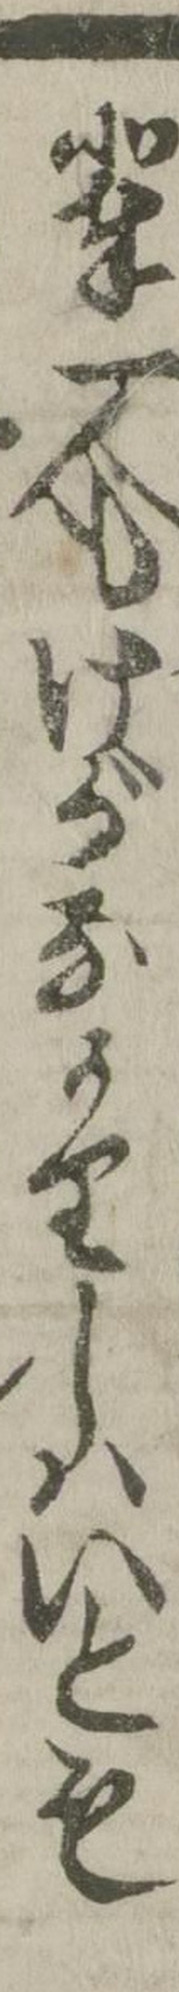輩一人もけがなかりしハいとも
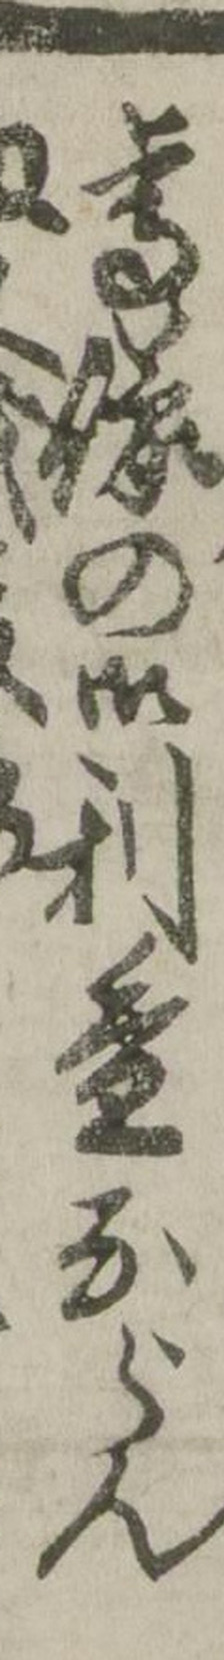尊像の御利益ならん
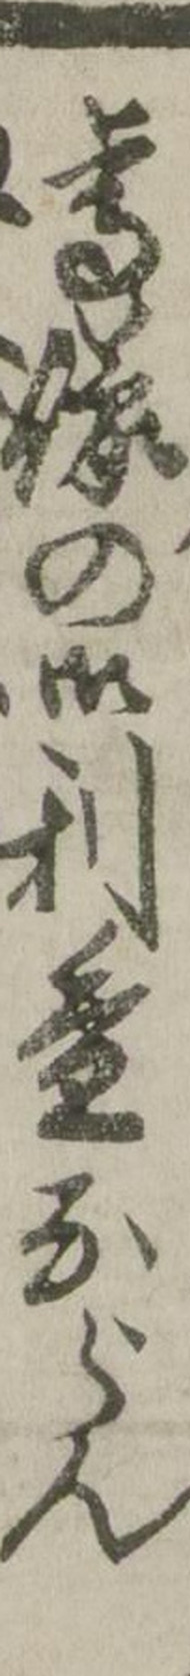尊像の御利益ならん
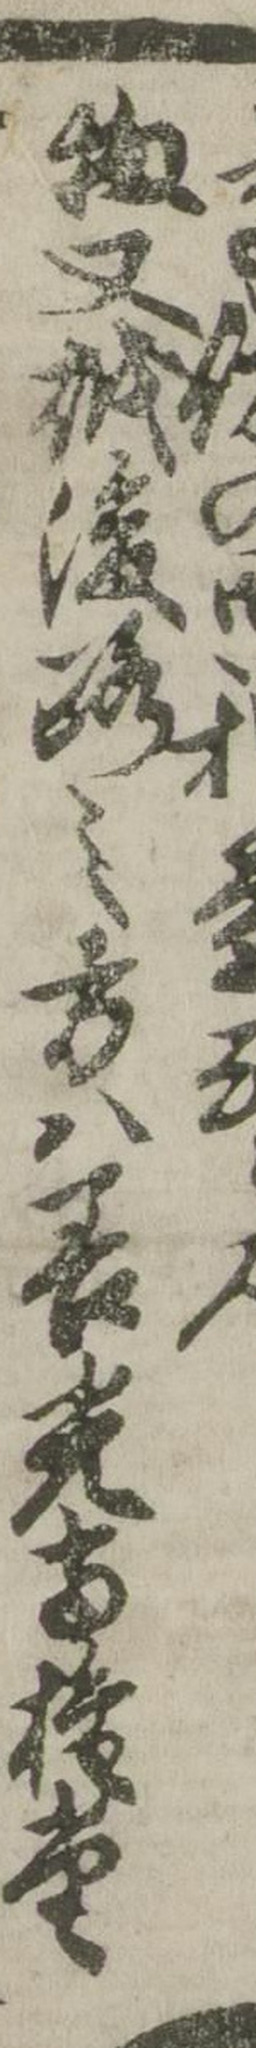扨又越後路之方ハ善光寺権堂
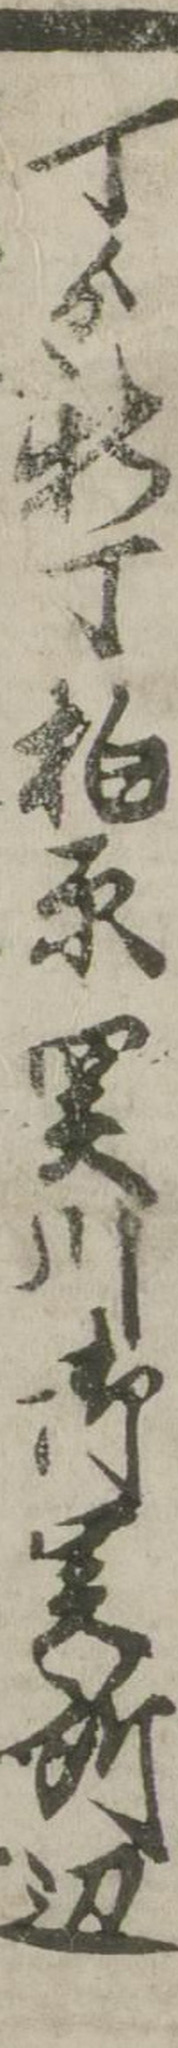丁ゟ新丁柏原関川御関所辺
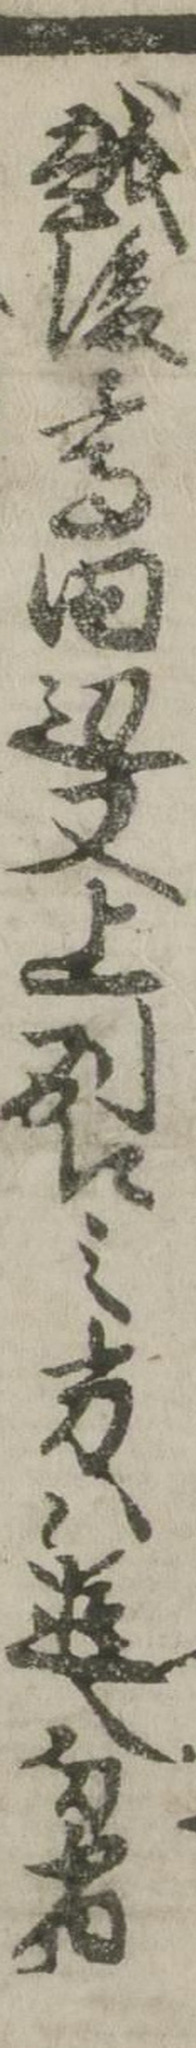越後高田辺又上州口之方ハ追分宿
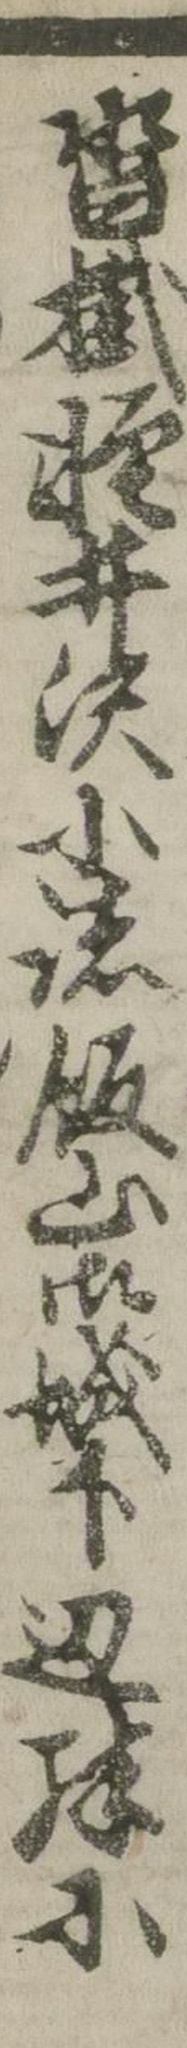沓掛軽井沢小諸飯山御城下辺殊に
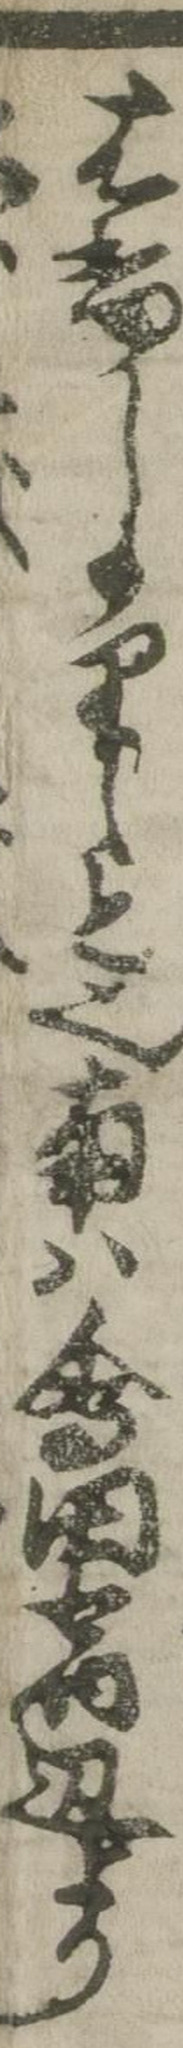はけしたりしと也南ハ会田宿辺より
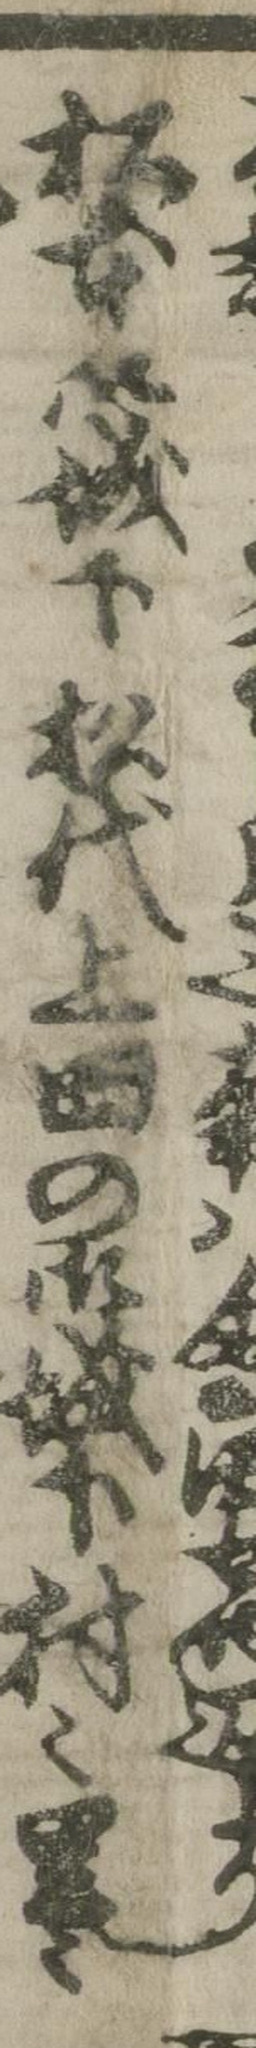松本御城下松代上田の御城下村々々
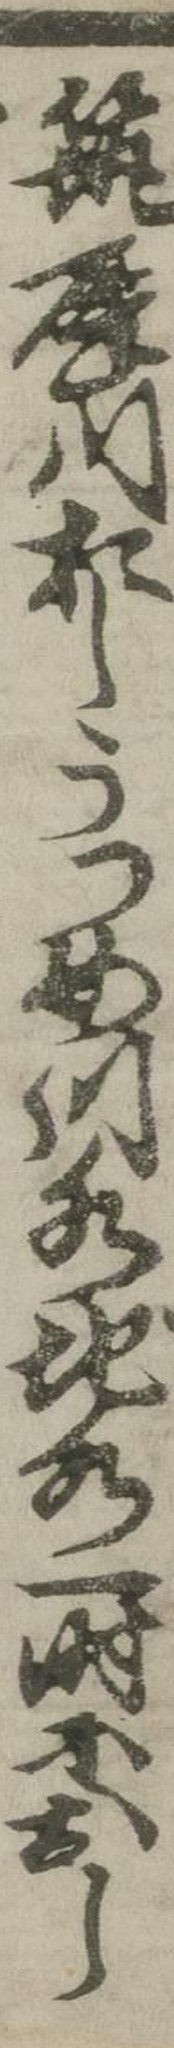筑摩川おしうつめ川水地水一時におし
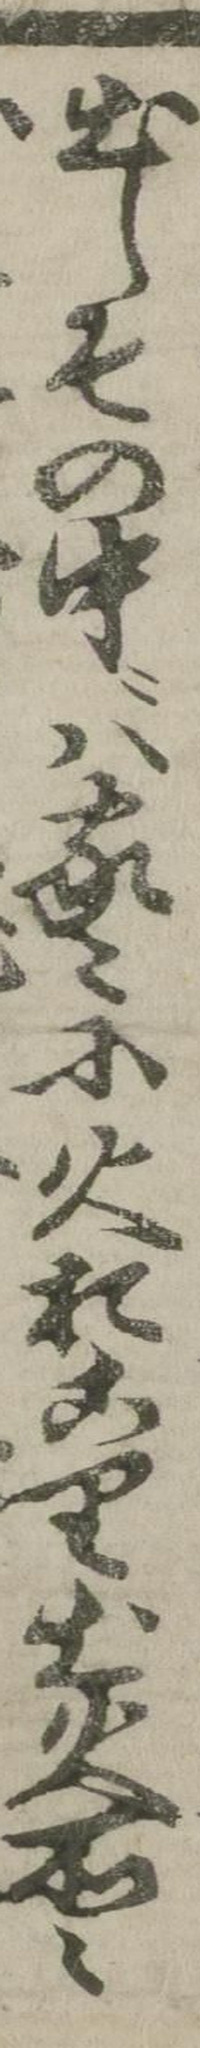出しその中二ハ家々に火おこり出火所々
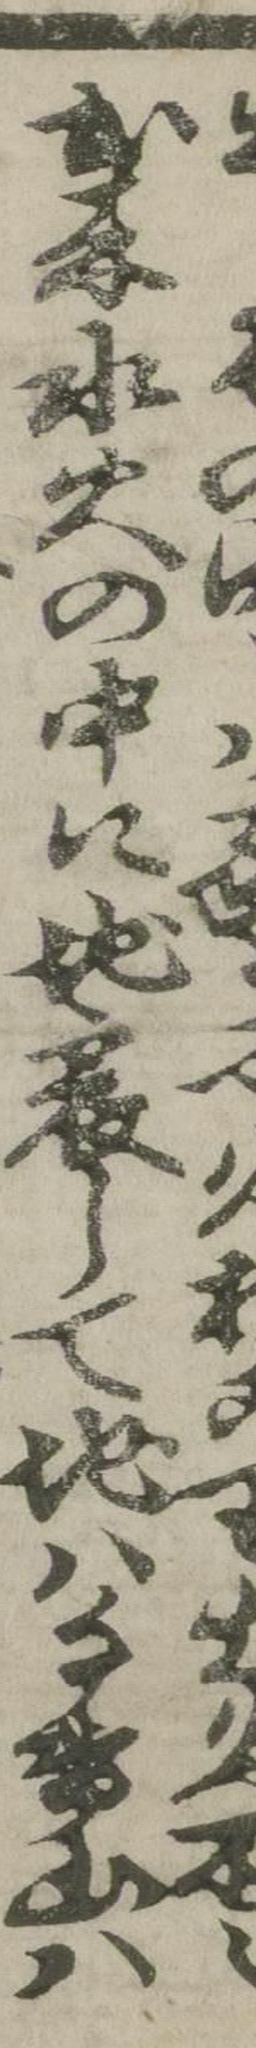出来水火の中に地震して地ハさけ山ハ
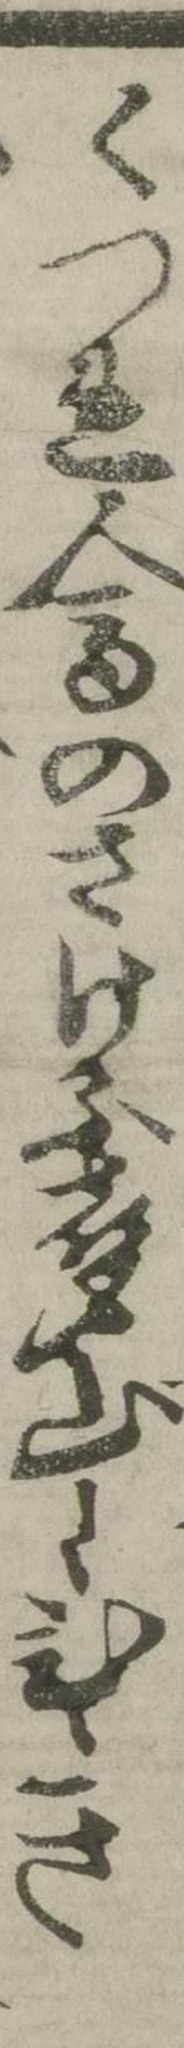くつれ人馬のさけふ声山二ひき
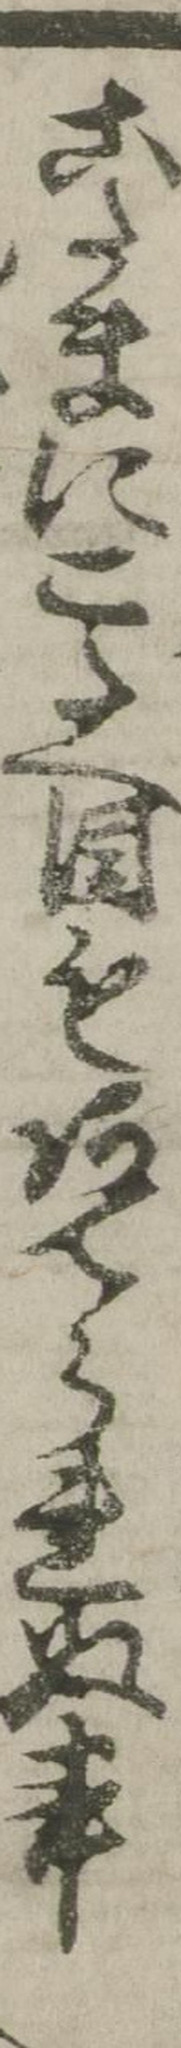こたまにこたへ目もあてられぬ事
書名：[善光寺地震に関する瓦版]
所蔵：東京大学地震研究所図書室 Earthquake Research Institute Library, The University of Tokyo, JAPAN
